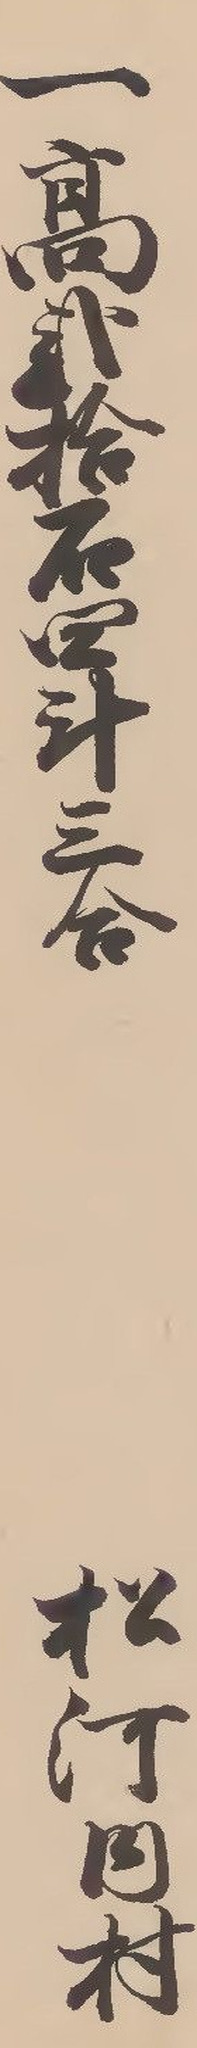一高弐拾石四斗三合松河内村

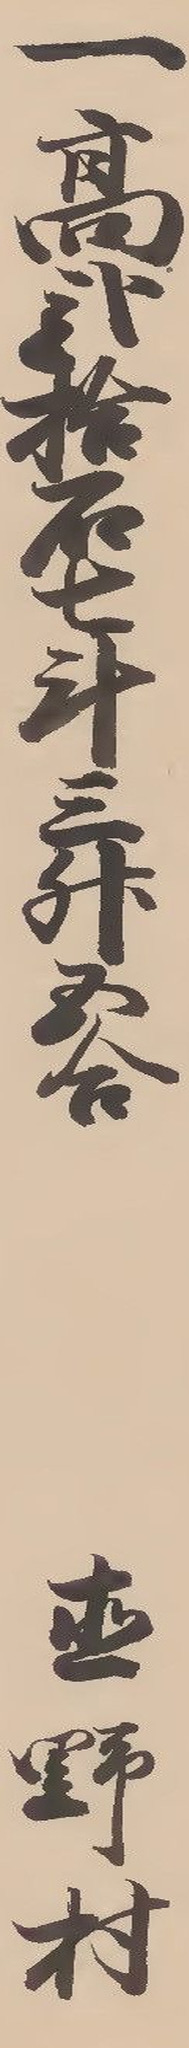一高弐拾石七斗三升五合直野村
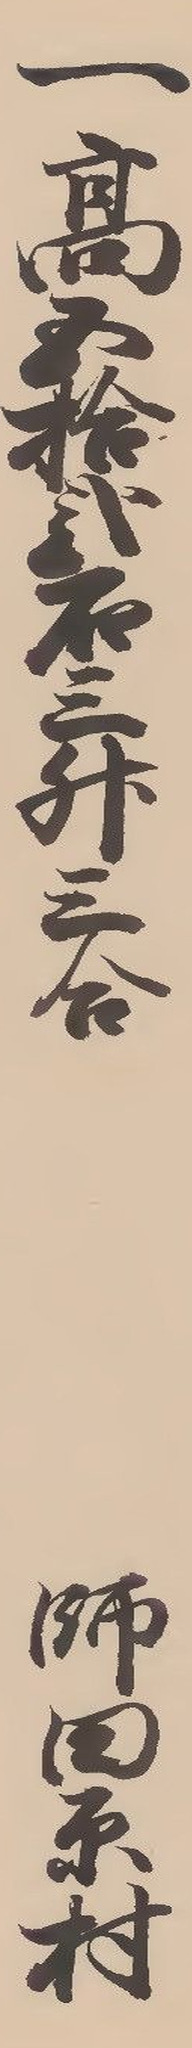一高五拾弐石三升三合師田原村
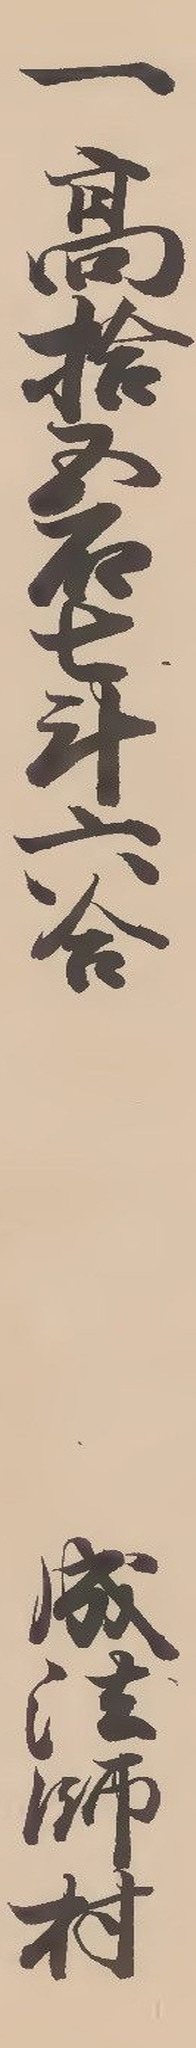一高拾五石七斗六合成法師村
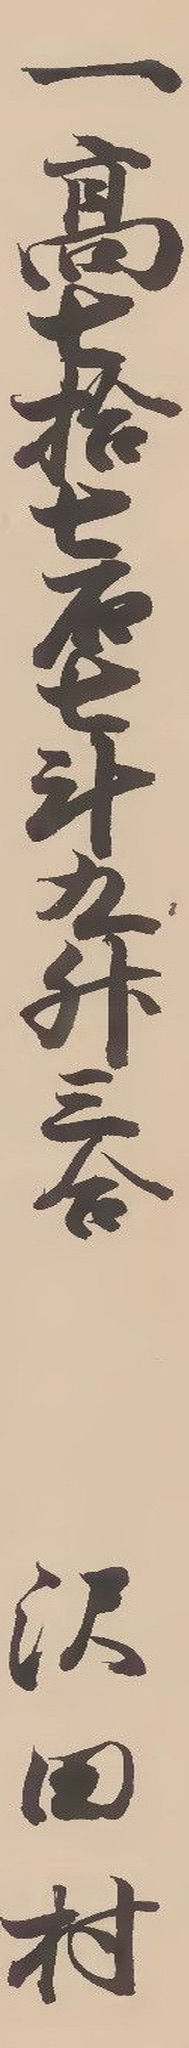一高七拾七石七斗九升三合沢田村
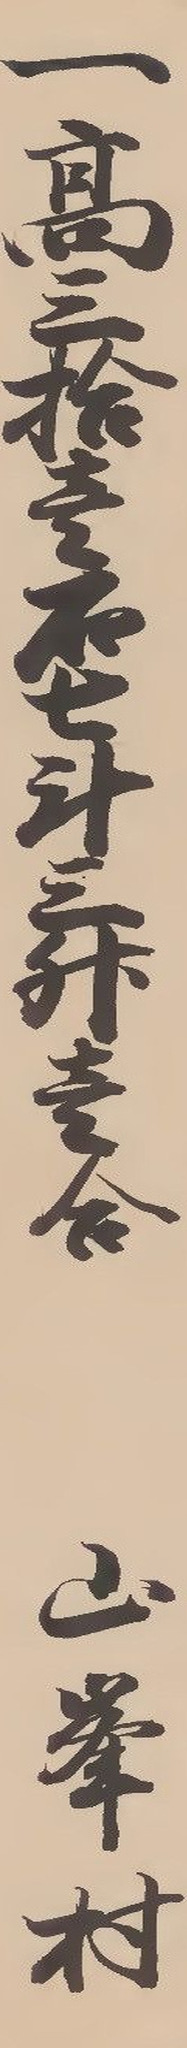一高三拾壱石七斗三升壱合山峰村
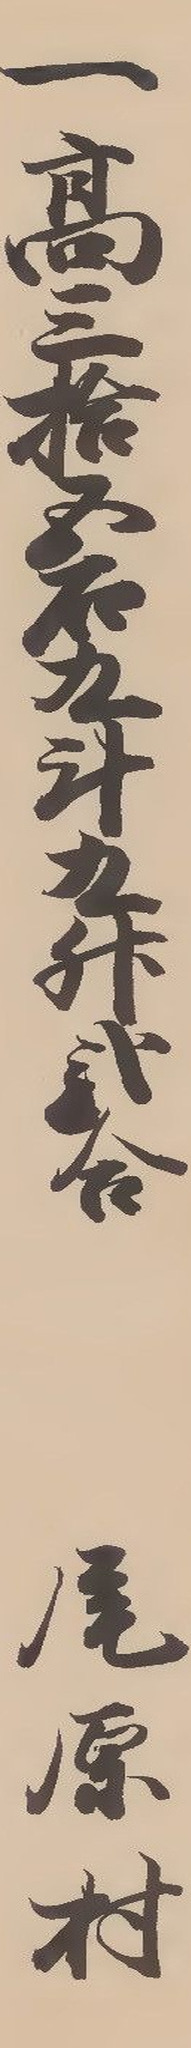一高三拾五石九斗九升弐合尾原村
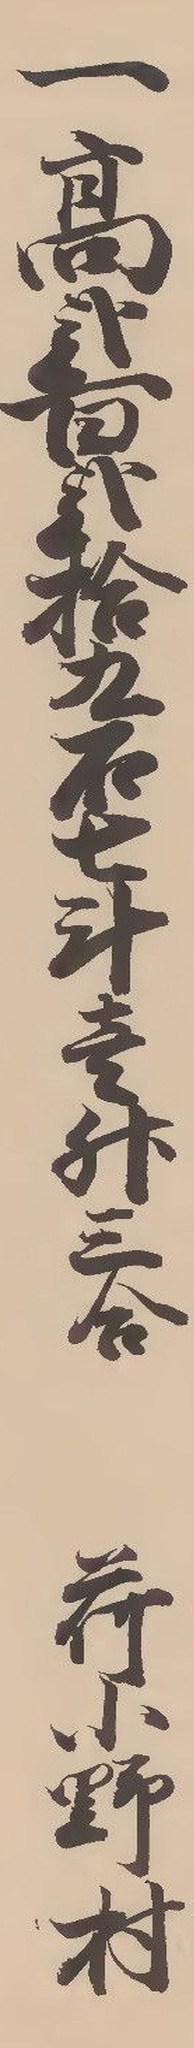一高弐百弐拾九石七斗壱升三合荷小野村
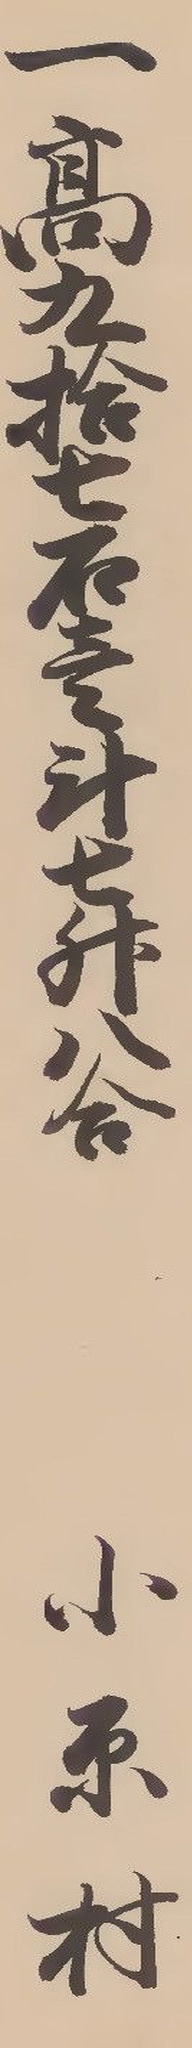一高九拾七石壱斗七升八合小原村

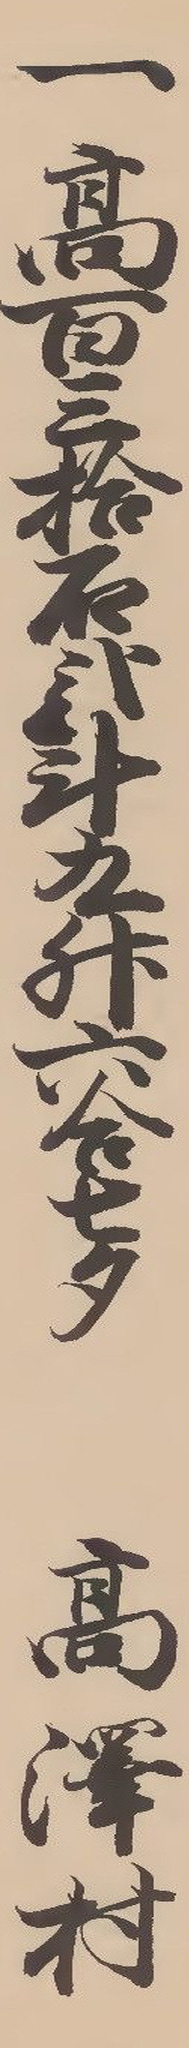一高百三拾石弐斗九升六合七勺高沢村
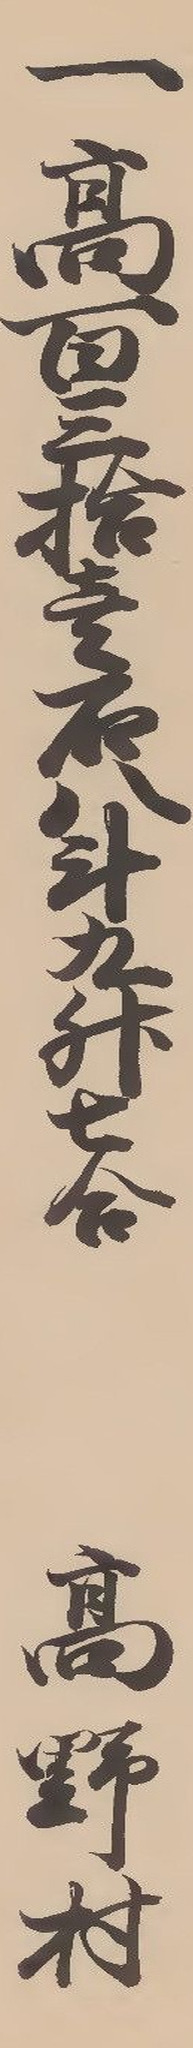一高百三拾壱石八斗九升七合高野村
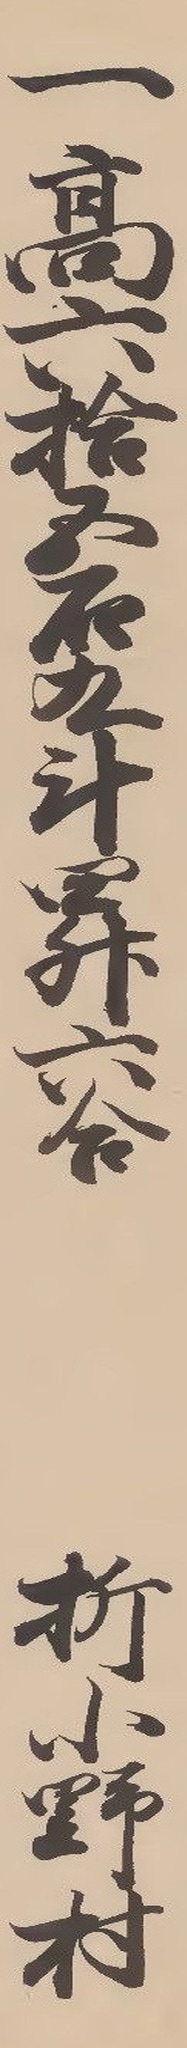一高六拾五石九斗四升六合折小野村
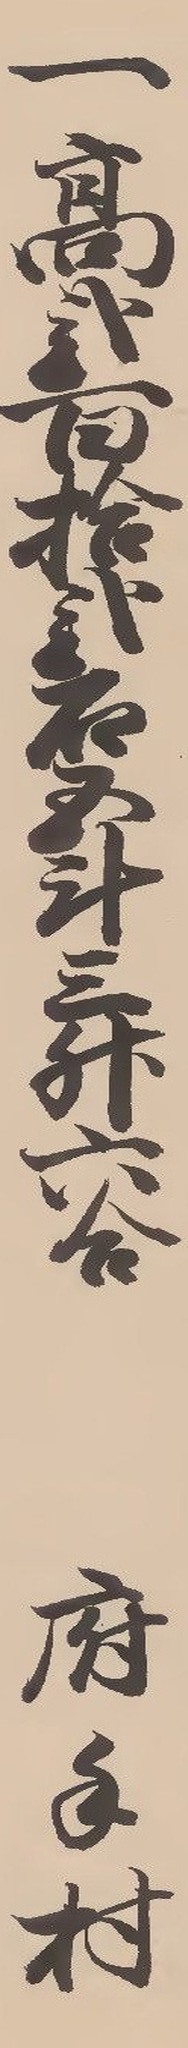一高弐百拾弐石五斗三升六合府手村
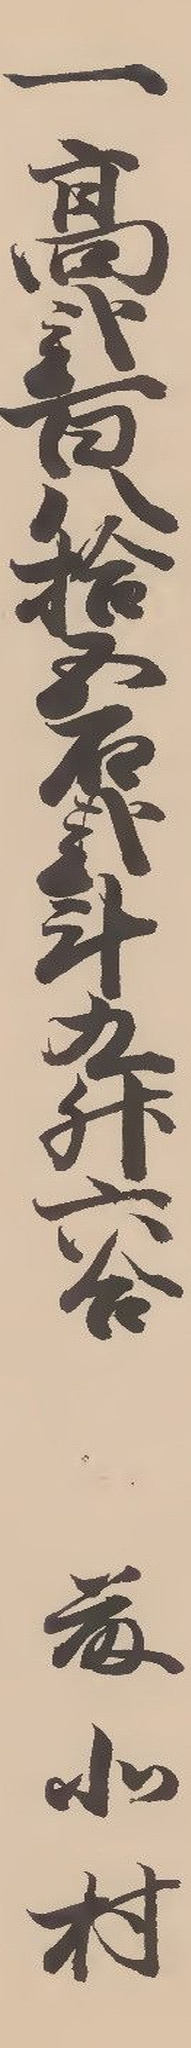一高弐百八拾五石弐斗九升六合藤北村
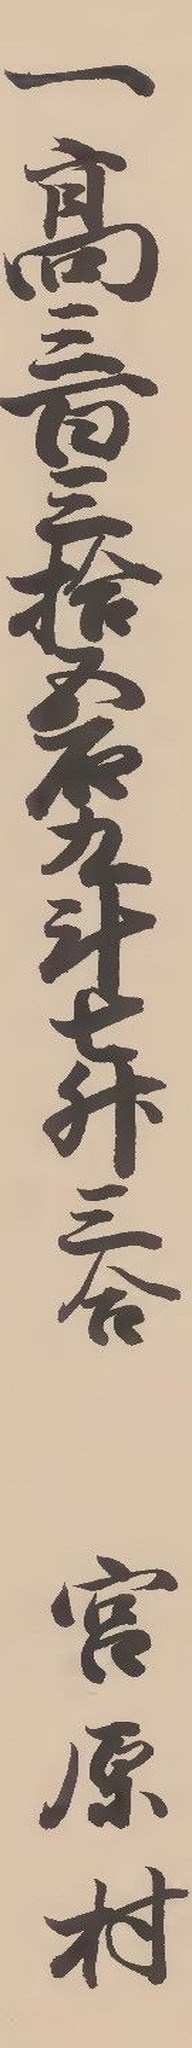一高三百三拾五石九斗七升三合宮原村
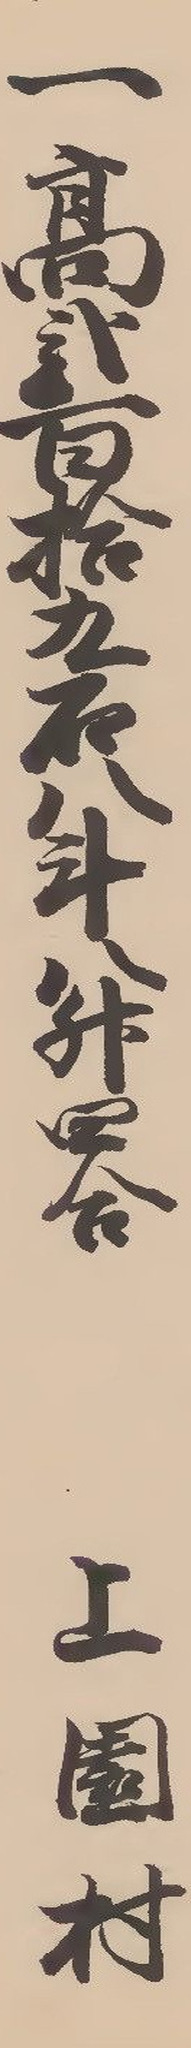一高弐百拾九石八斗八升四合上園村
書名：豊後国郷帳
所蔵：国立公文書館 National Archives of Japan
